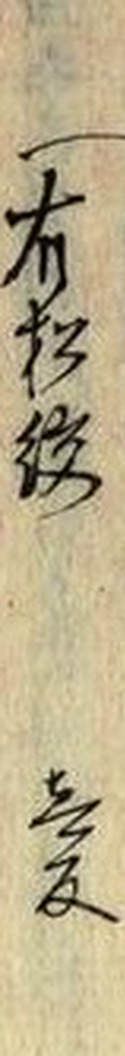有松絞壱反
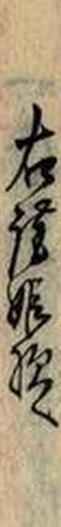右謹姫様へ
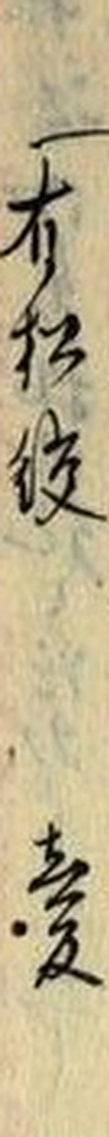有松絞壱反
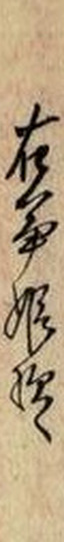右箏姫様へ
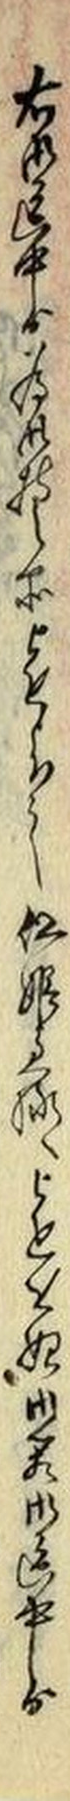右御道中ゟ為御持之品被進被下之但姫君様へ被進を始御箱御道中ゟ
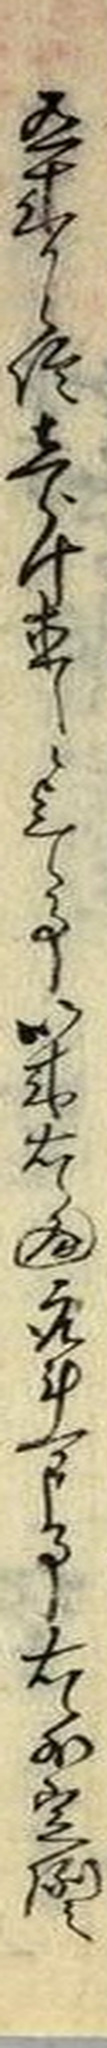有来候侭壱分斗直し候迄之事以来右之通取計可申事右之外定例之
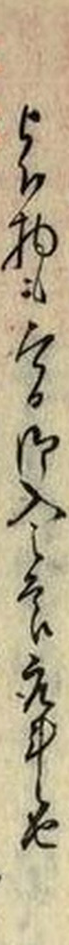被下物も今日御入之節取斗候由
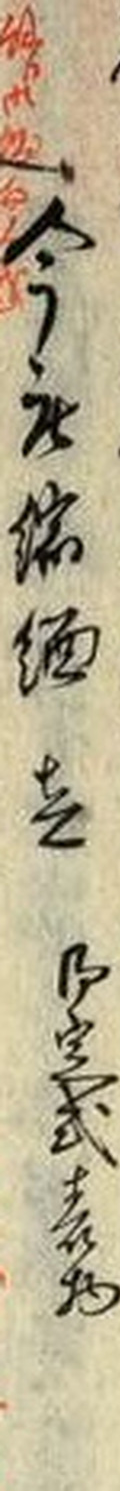今庄縮緬壱御定式表物
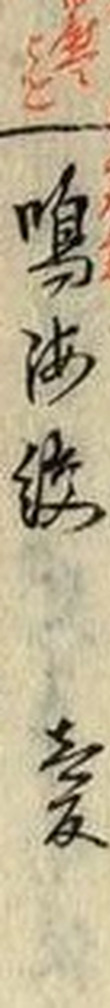鳴海絞壱反
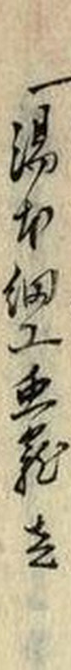湯本細工虫籠壱
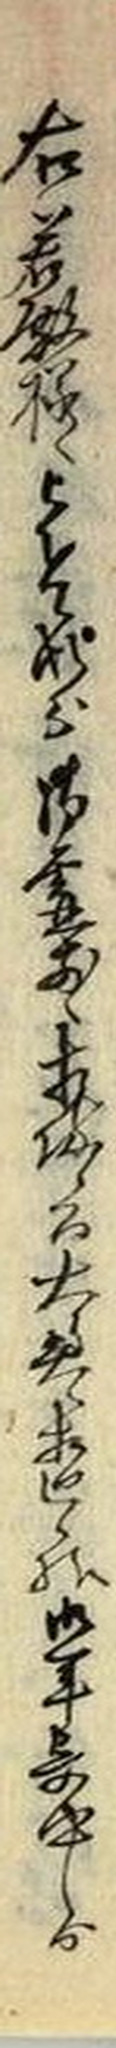右若殿様へ被進候御分御霊前へ相備候間大奥へ相廻候様御年寄中ゟ
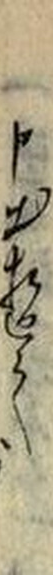申出相廻之
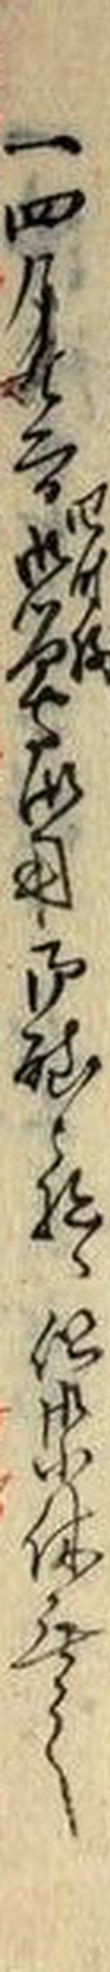一四月廿二日四時揃御留守御用御聴被遊候但御小休無之
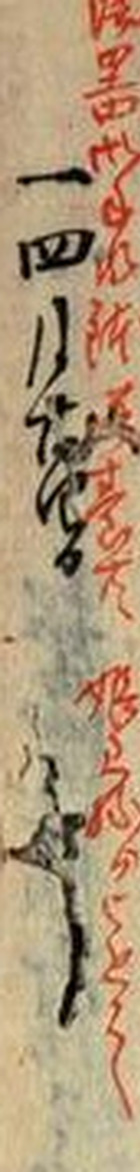一四月廿四日
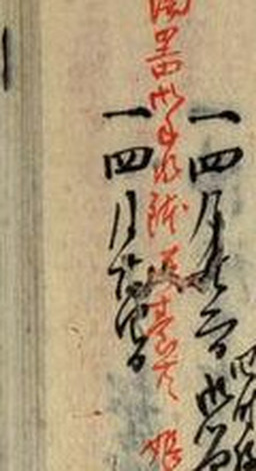一四月廿四日

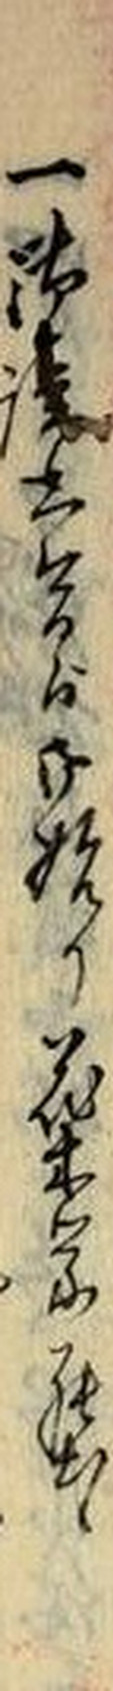一御読書今日ゟ御始り花木栄罷出候
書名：少傅日録抄（斉承付側向頭取日記、在府）
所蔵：福井県文書館 Fukui Prefectural Archives
